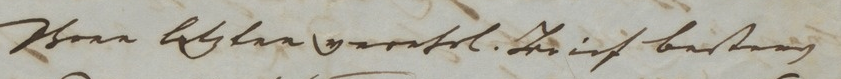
Ihren letzten verehrl. Brief bestens
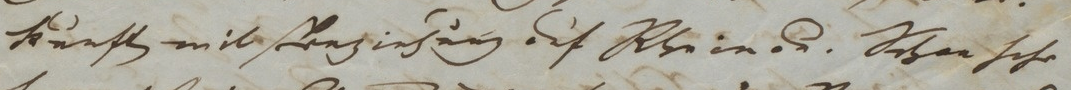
kunft mit Beziehung auf Rheinau. Schon sehr
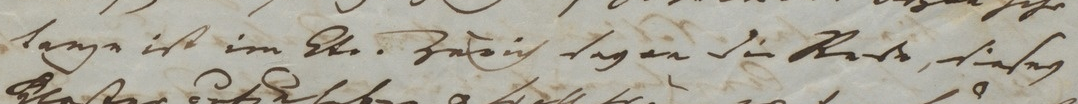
lange ist im Ctn. Zürich davon die Rede, dieses
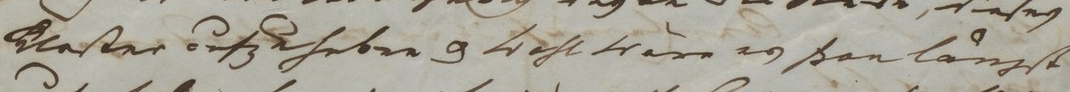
Kloster aufzuheben & wohl wäre es schon längst
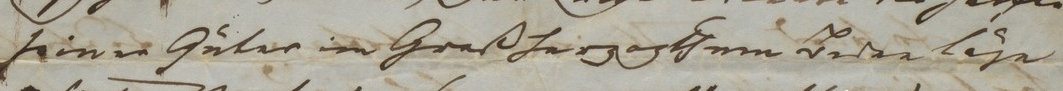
seiner Güter im Großherzogthum Baden läge
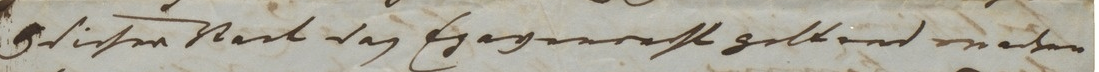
& dieser Staat das Epavenrecht geltend machen
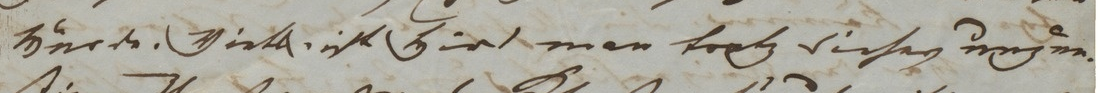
würde. Vielleicht wird man trotz dieses ungün-
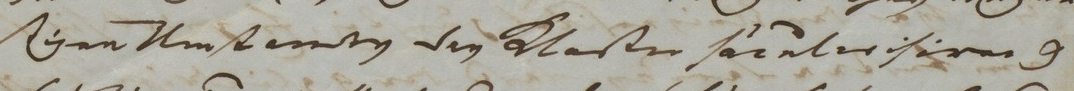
stigen Umstandes das Kloster säcularisiren &
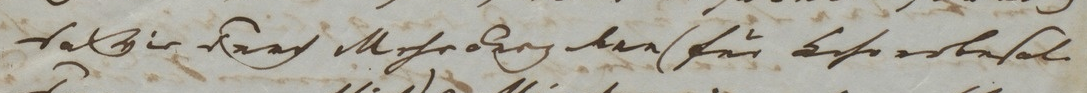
da wir durch Mehrausgaben (für Lehrerbesol-
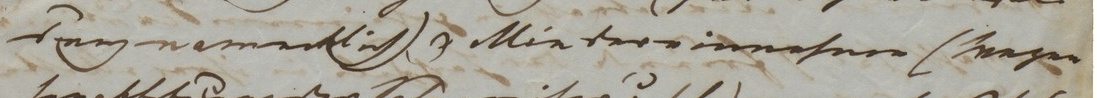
dung namentlich) & Mindereinnahmen (wegen
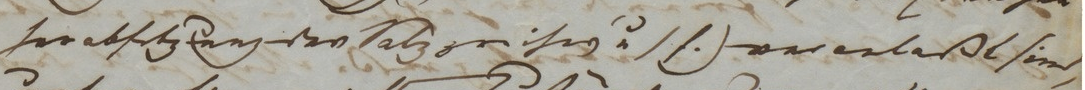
Herabsetzung des Salzpreises usf.) veranlaßt sind,
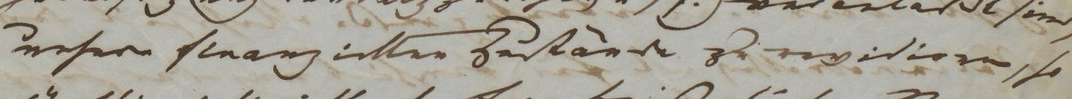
unsere finanziellen Zustände zu revidiren, so
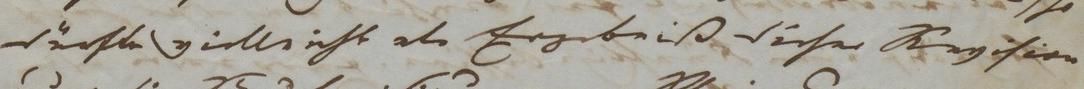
dürfte vielleicht als Ergebniß dieser Revision
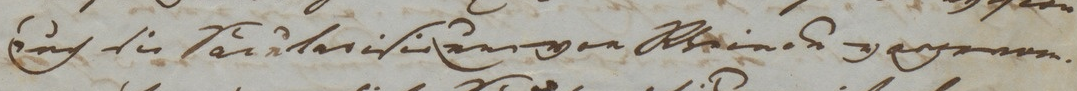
auch die Säcularisirung von Rheinau vorgenom-
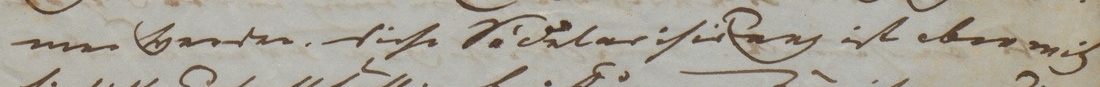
men werden. Diese Säcularisirung ist aber mit
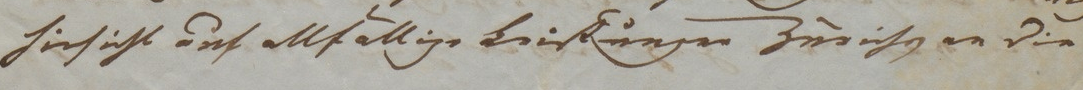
Hinsicht auf allfällige Leistungen Zürichs an die
